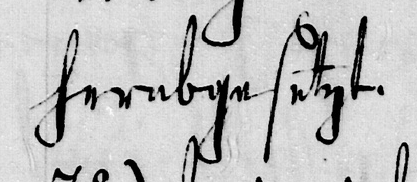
herabgesetzt.
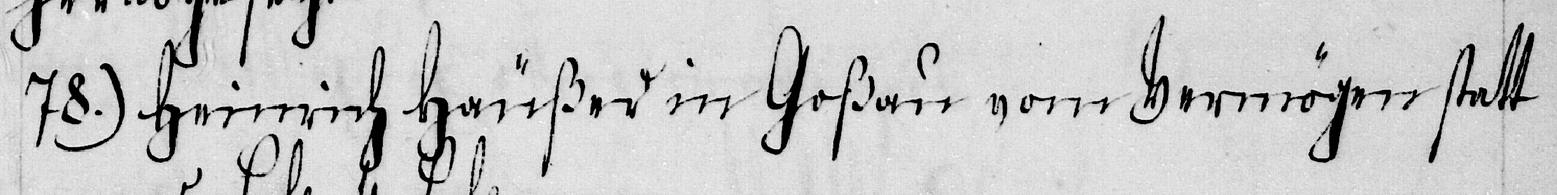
78.) Heinrich Häußer in Goßau vom Vermögen statt
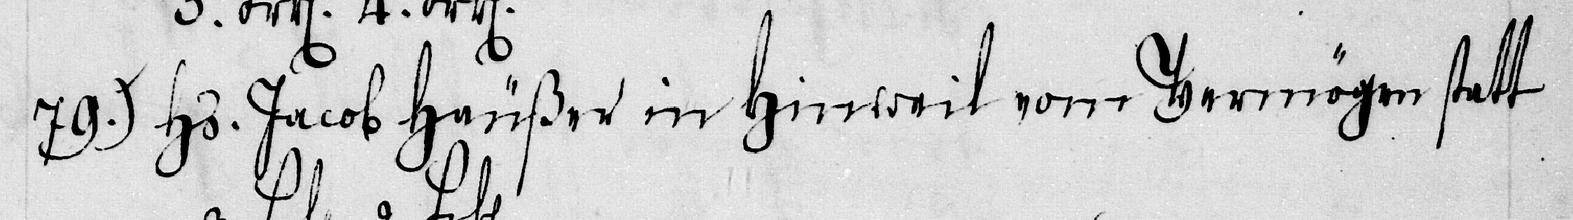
79.) Hs. Jacob Häußer in Hinweil vom Vermögen statt
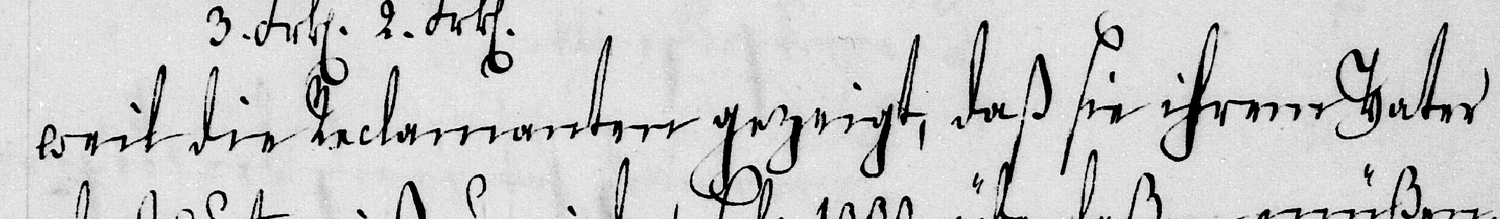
weil die Reclamanten gezeigt, daß sie ihrem Vater
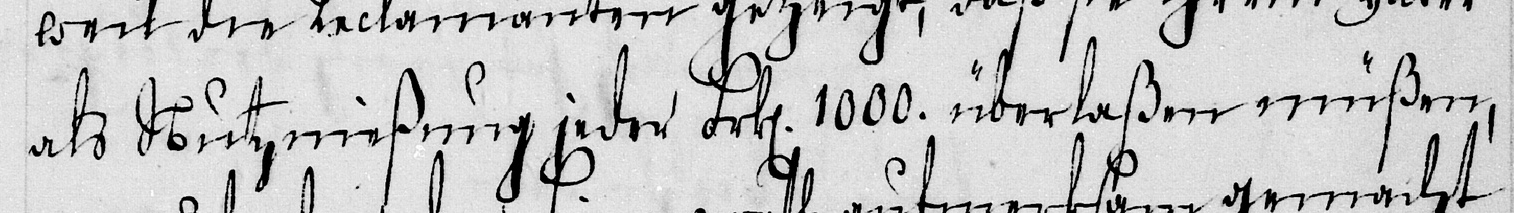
als Nutznießung jeder Frk[en]. 1000. überlaßen müßen,
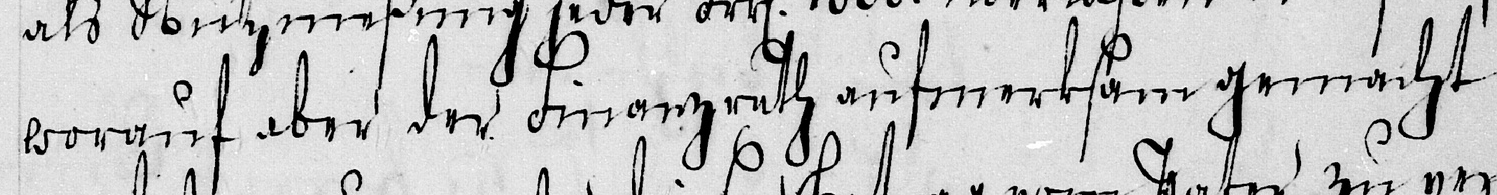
worauf aber der Finanzrath aufmerksam gemacht
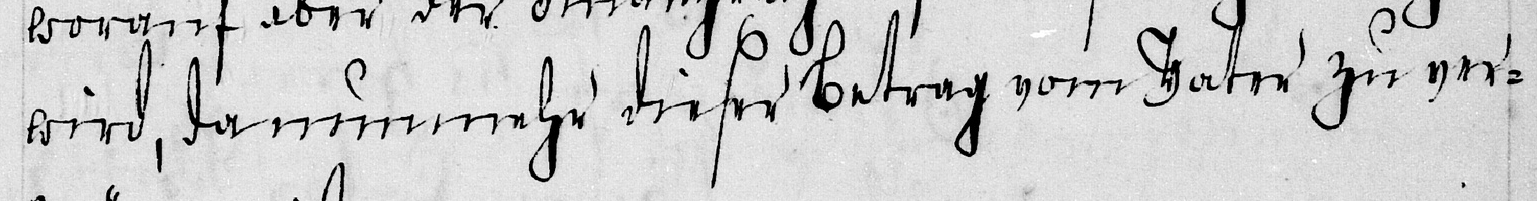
wird, da nunmehr dieser Betrag vom Vater zu ver¬
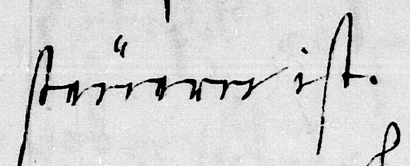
steuern ist.
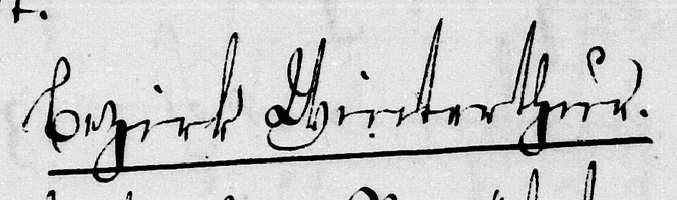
Bezirk Winterthur.
